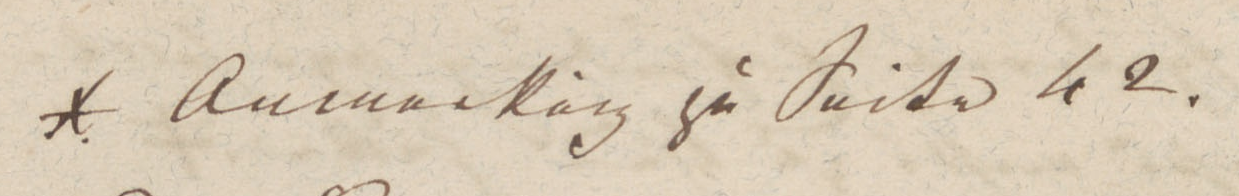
% Anmerkug zu Seite 42.
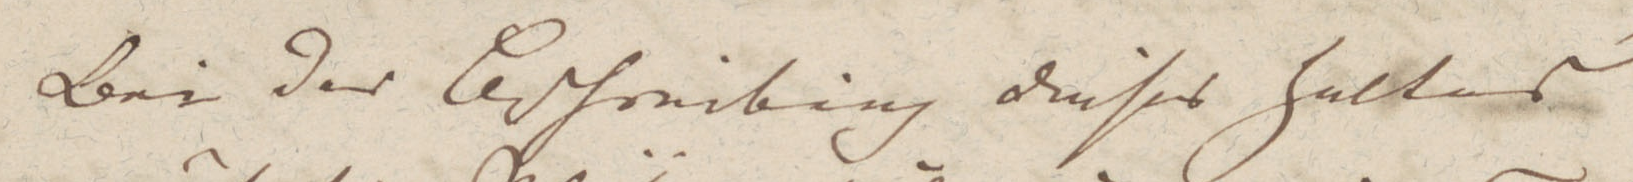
Bei der Beschreibung dieses Zeltes
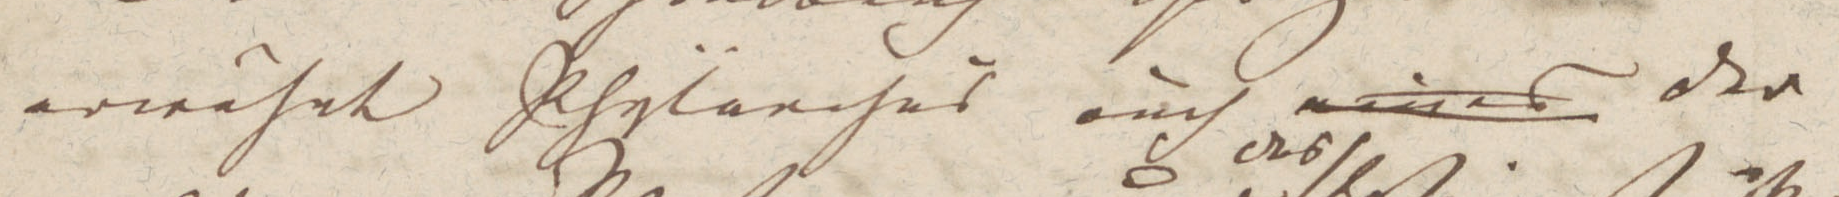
erwähnt Phylarchus auch eines der
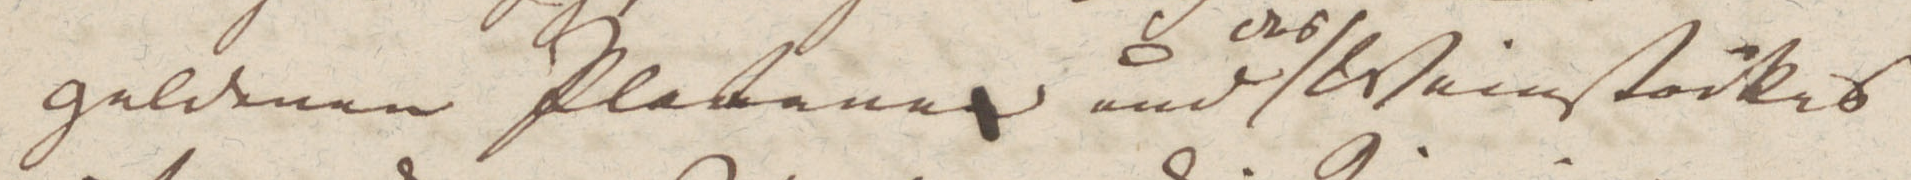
goldenen Platanen und des Weinstockes
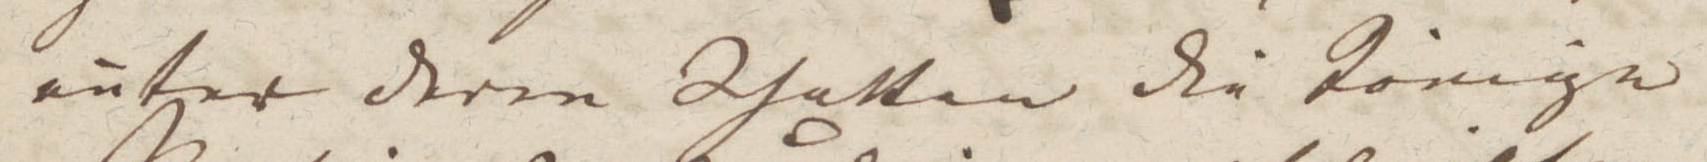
unter deren Schatten die Könige
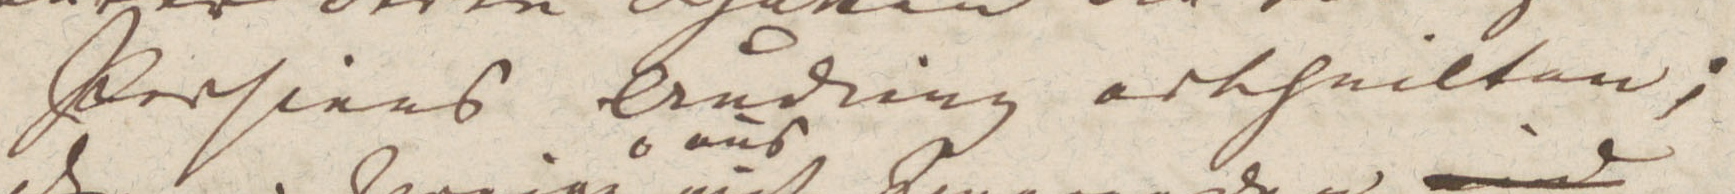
Persiens Audienz ertheilten;
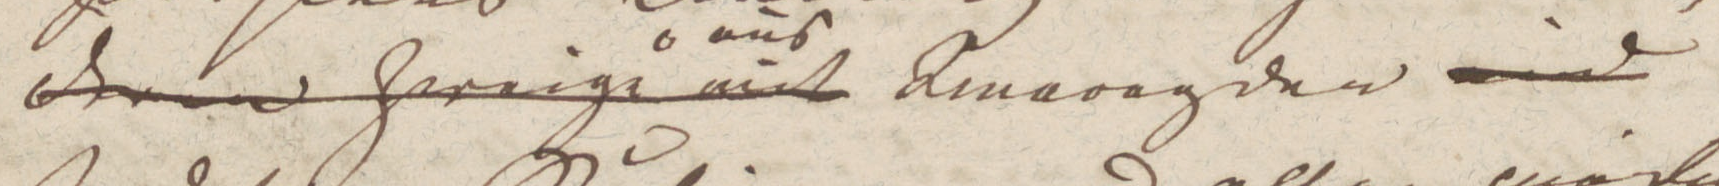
deren Zweige mit aus Smaragden und
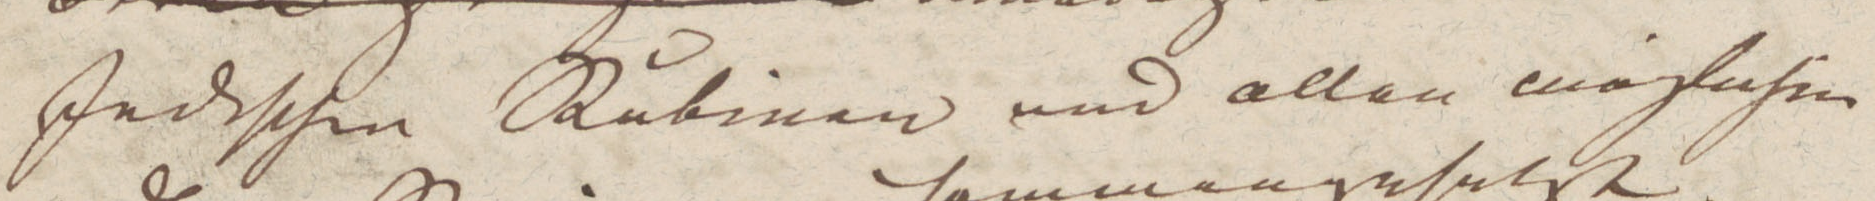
Indischen Rubinen und allen möglichen
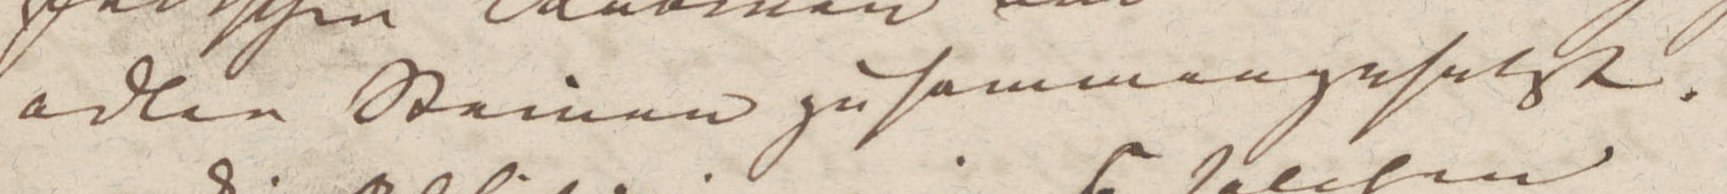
edlen Steinen zusammengesetzt.
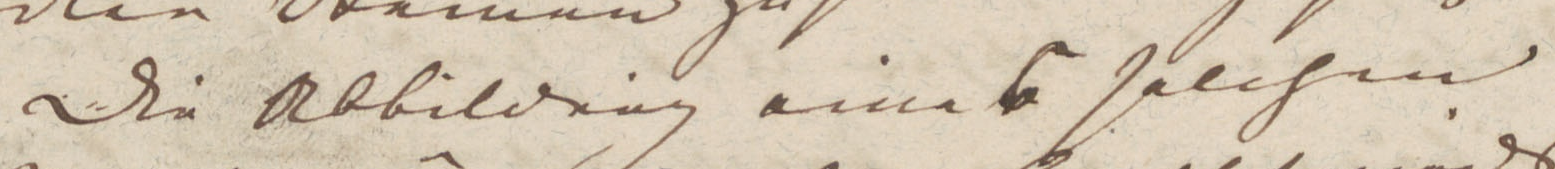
Die Abbildung eines solchen
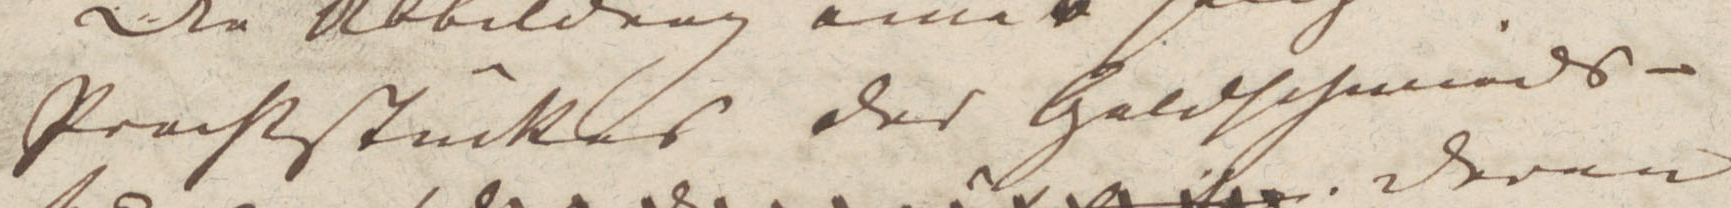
Prachtstückes der Goldschmieds-
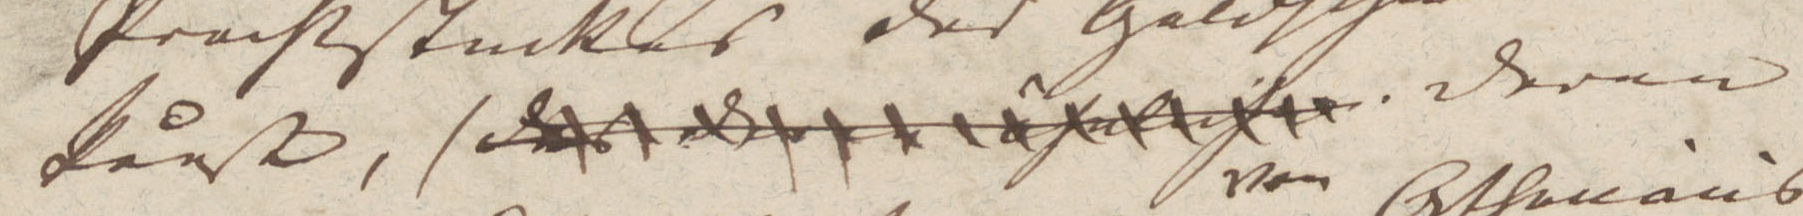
kunst, (das deren ähnliche deren
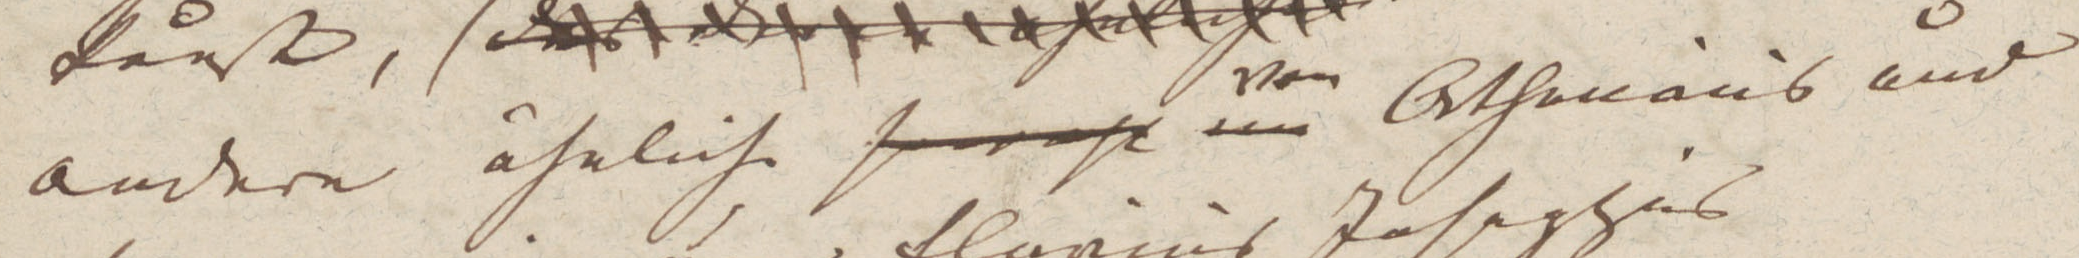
andere ähnlich sowohl im von Athenäus und
